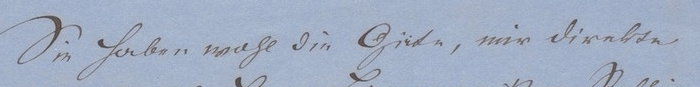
Sie haben wohl die Güte, mir direkte
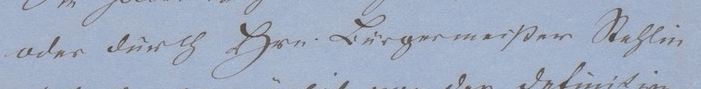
oder durch Hrn. Bürgermeister Stehlin
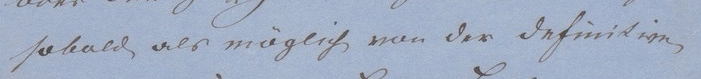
sobald als möglich von der definitiven
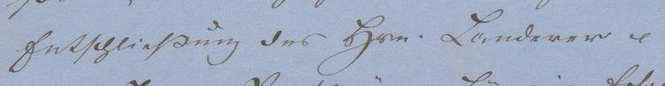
Entschließung des Hrn. Landerer &
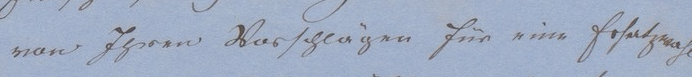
von Ihren Vorschlägen für eine Ersatzwahl
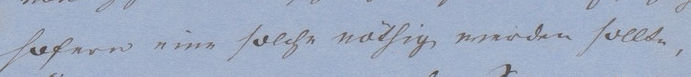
sofern eine solche nöthig werden sollte,
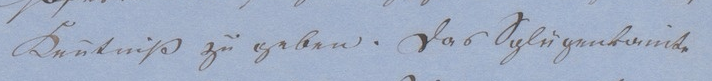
Kenntniß zu geben. Das Splügenkomite
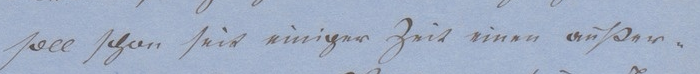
soll schon seit einiger Zeit einen außer-
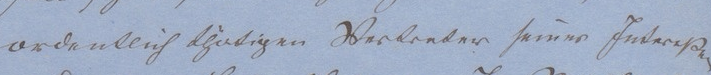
ordentlich thätigen Vertreter seiner Intereßen
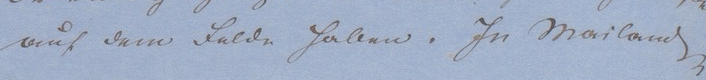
auf dem Felde haben. In Mailand
